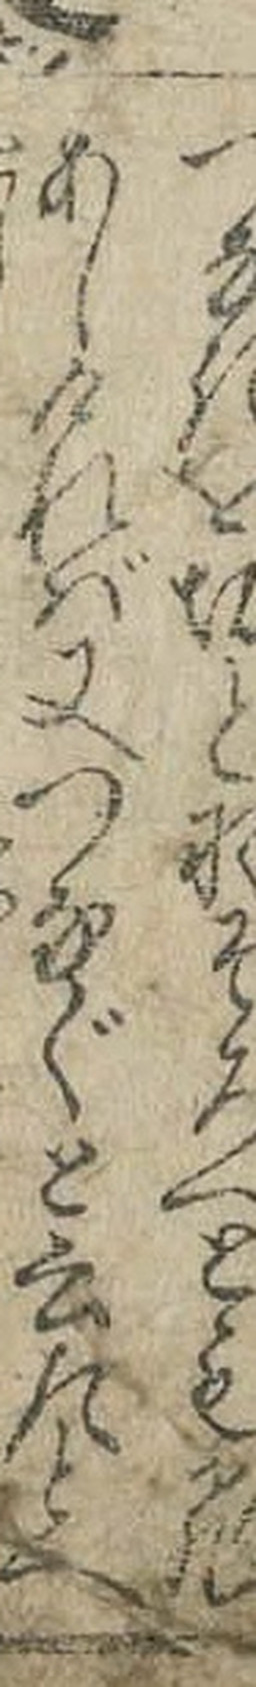あしければ又つなぐと云たとへ
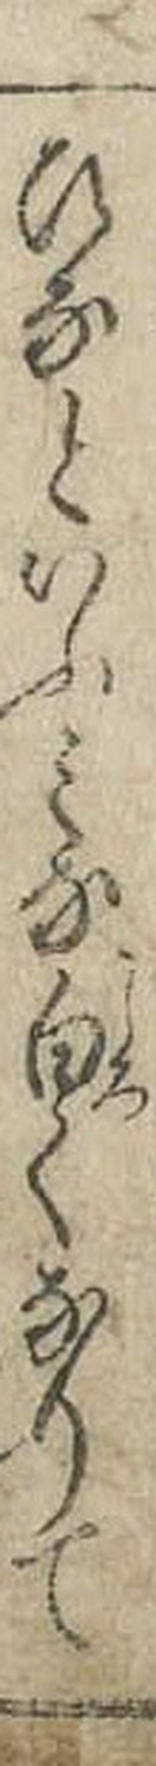ひなといふみな白くなりて
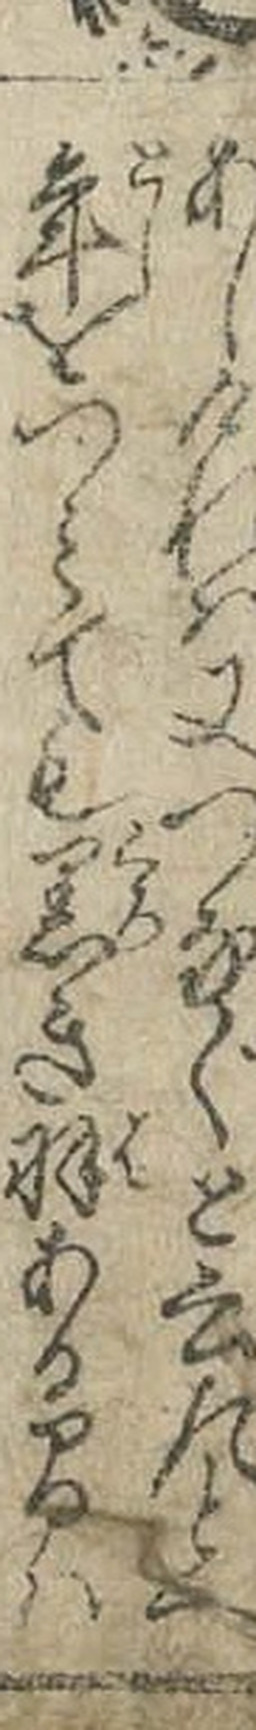年をつみても黒き羽ある間は
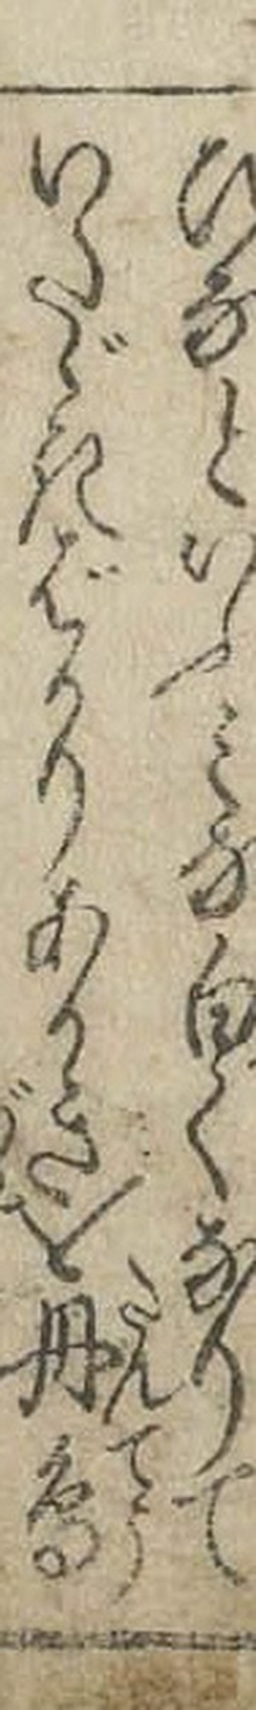いたゞきばかりあかきを丹鳥
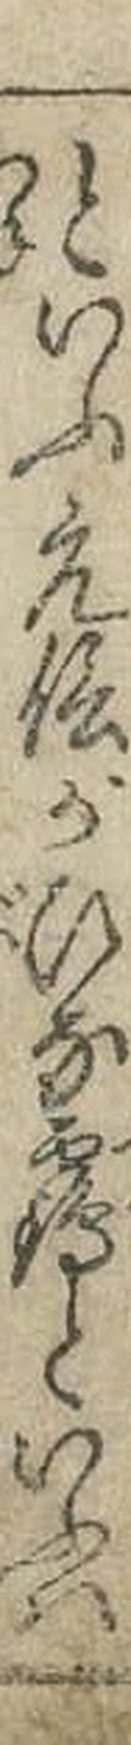といふ元信がひな鶴といふは
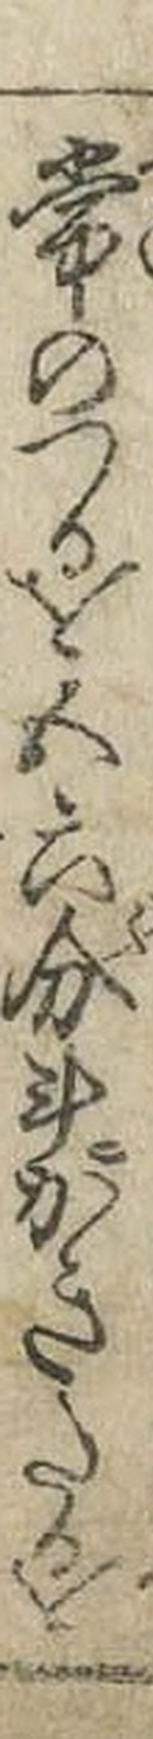常のつるを五六分計にかきたるを
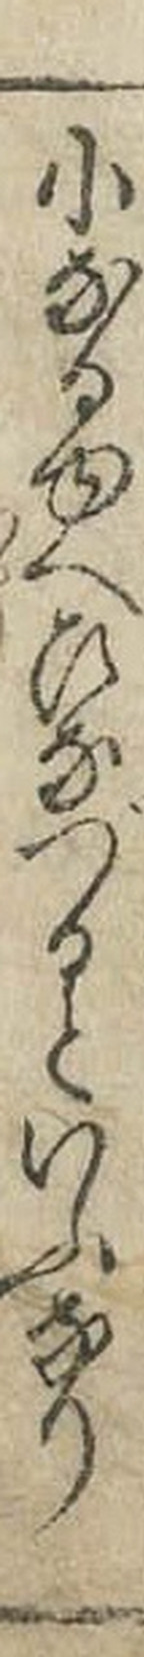小なるゆへひなづるといふなり
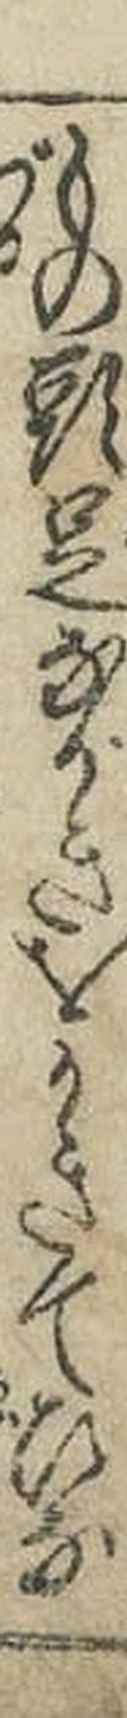もの頭足ながきをかきてひな
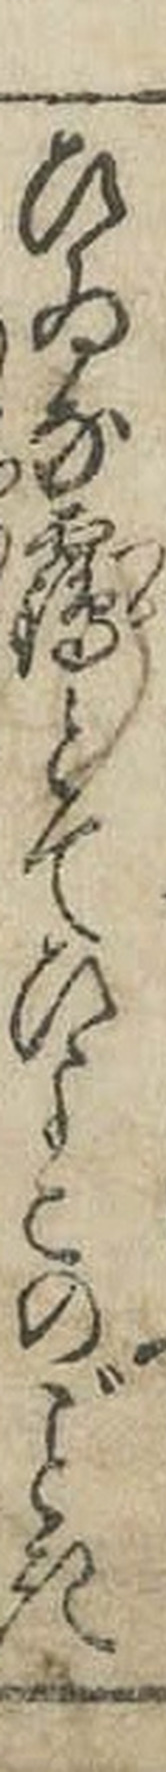ひゐな鶴とてひよこのごとき
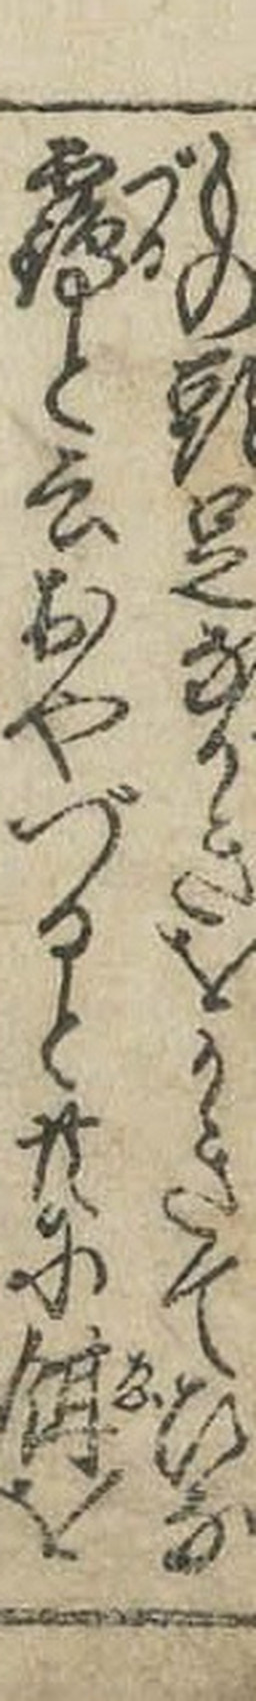鶴と云おやづると共に餌を
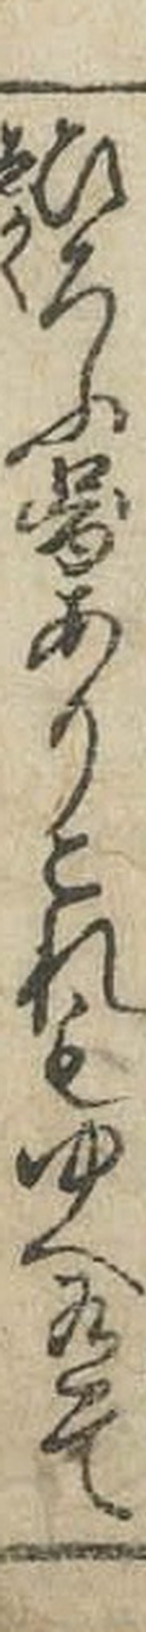ひろふ図ありこれもゆへ有て
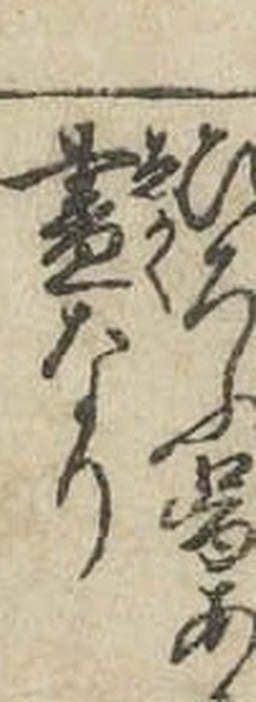画なり
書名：絵本写宝袋 9巻 8之巻
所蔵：東京学芸大学教育コンテンツアーカイブ
